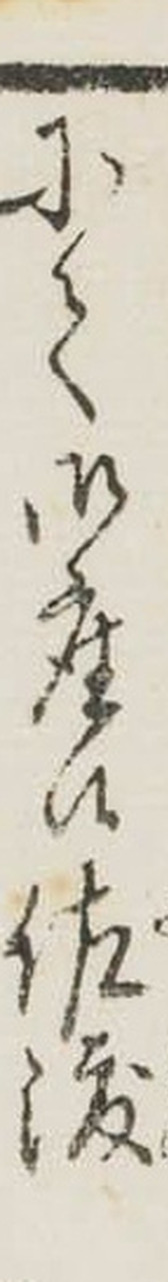にて御座候佐渡
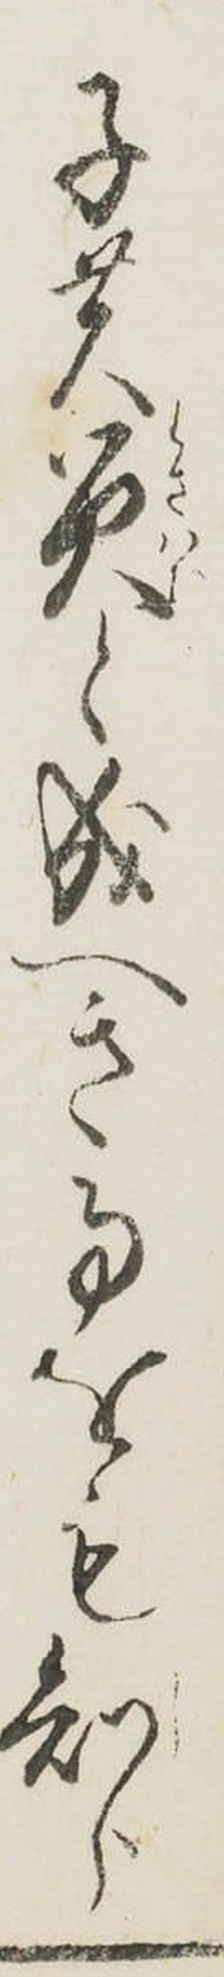子の災と成へき事をも知ら
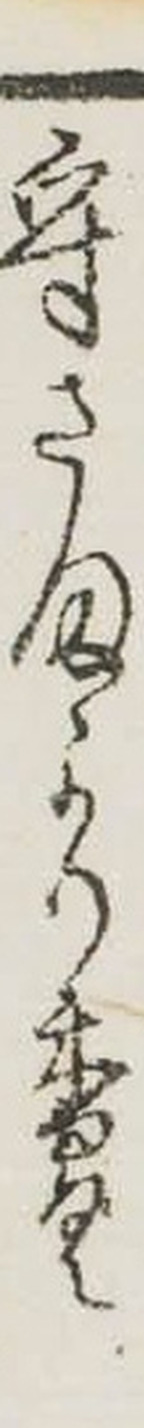守さまより香具
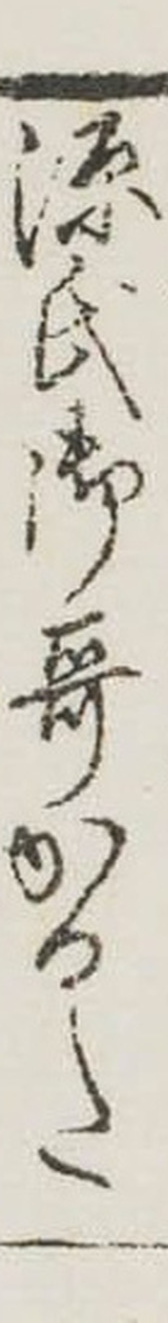源氏御哥かるた
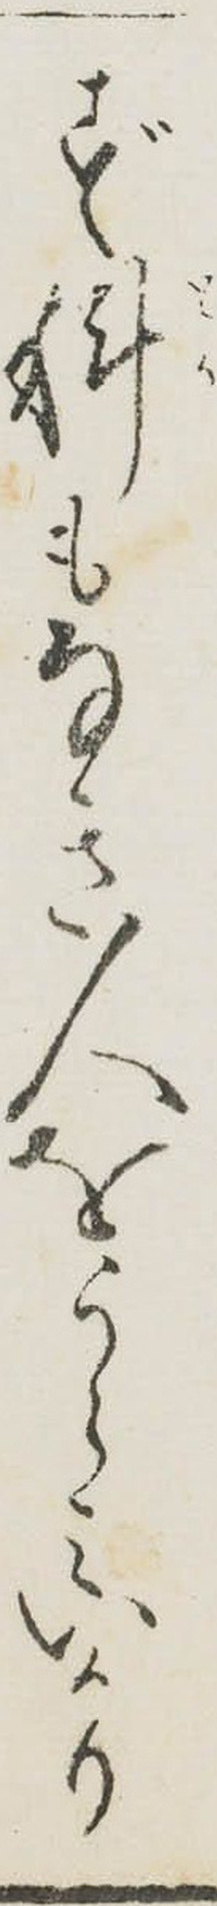ず科もなき人をうらみいかり
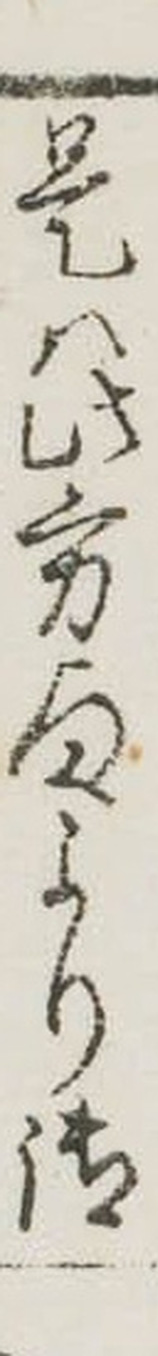是は此方さまより御
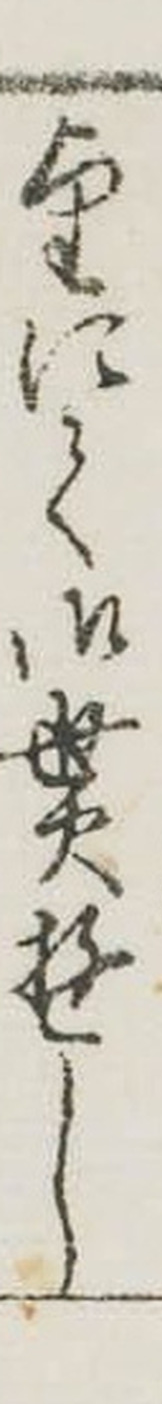望にて御貰遊し
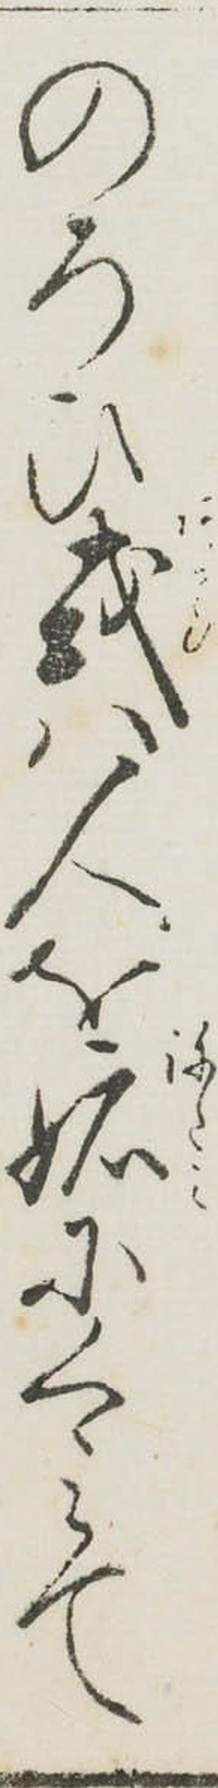のろひ或は人を妬にくみて
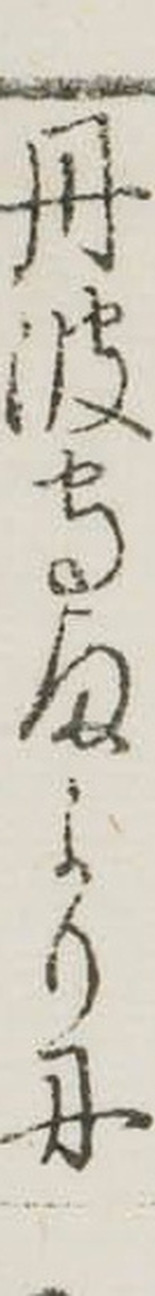丹波守さまより丹
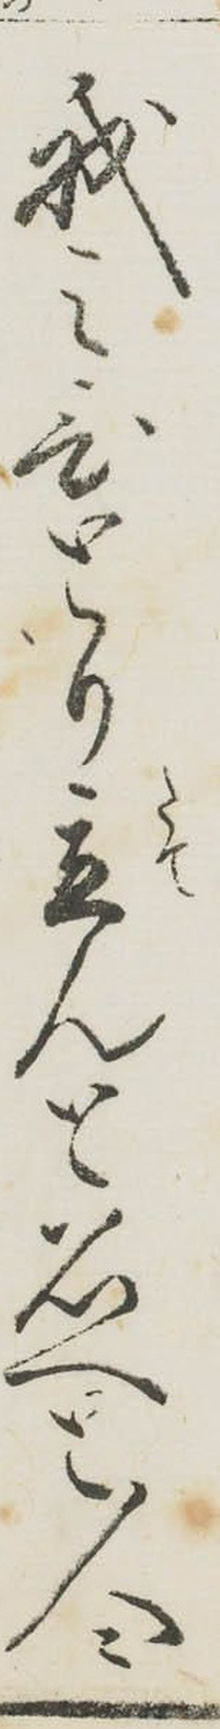我みひとり立んと思へと人
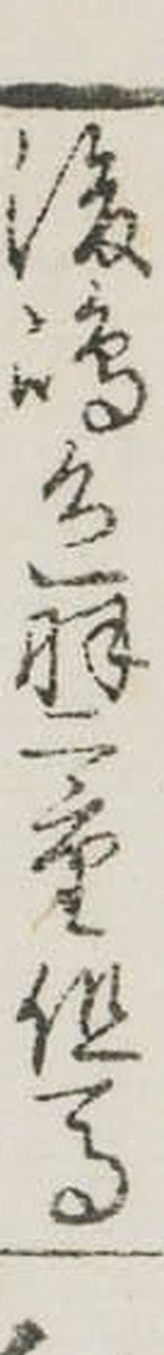後嶋色羽二重但馬
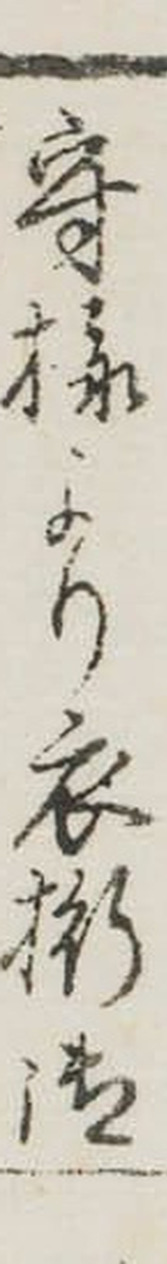守様より衣桁御
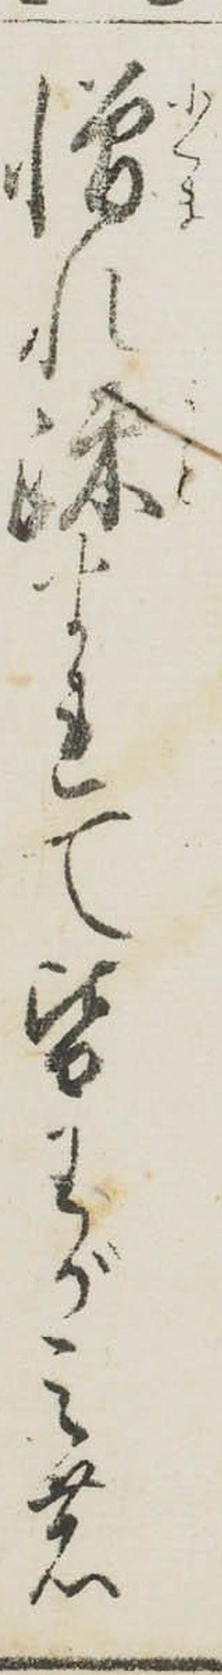憎れ疎まれて皆わがみの
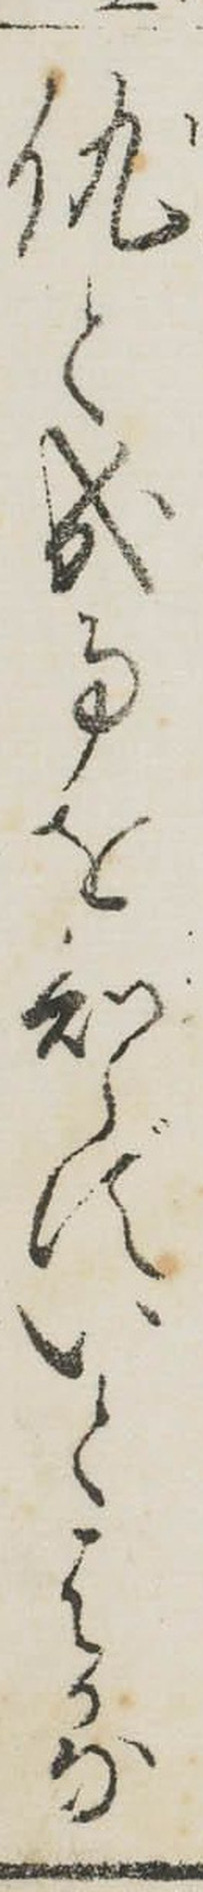仇と成事を知らずいとはかな
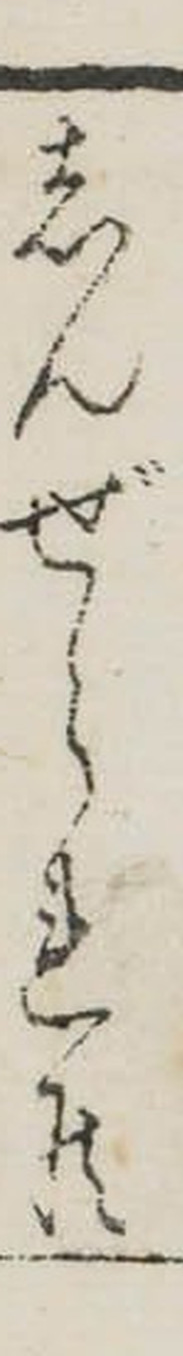しんぜられ候
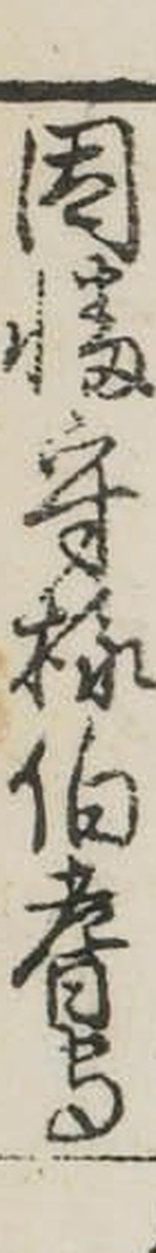因幡守様伯耆守
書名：女大学
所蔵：東京学芸大学教育コンテンツアーカイブ
